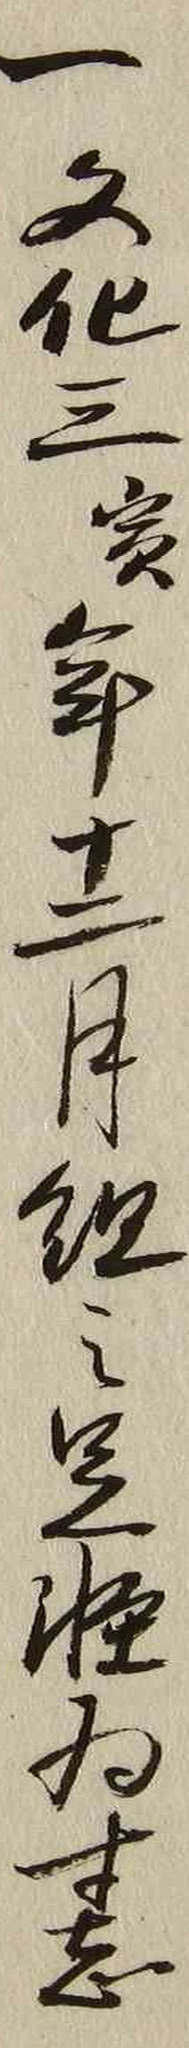一文化三寅年十二月組之足軽為寸志
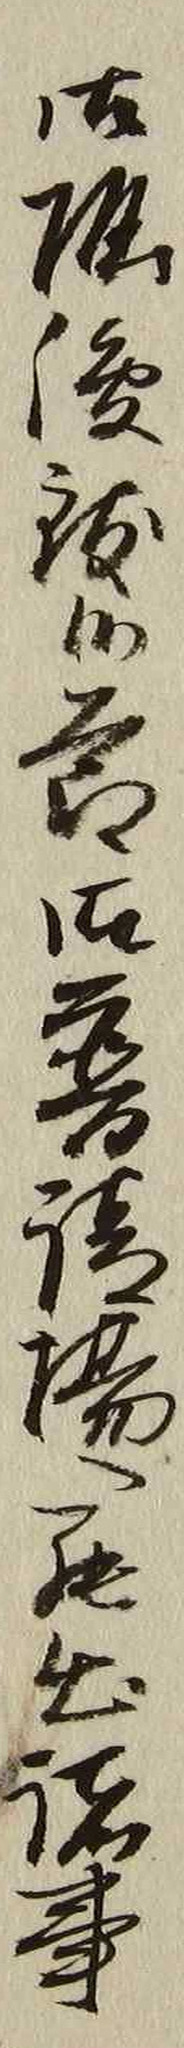御堀浚致候節御普請場へ罷出諸事
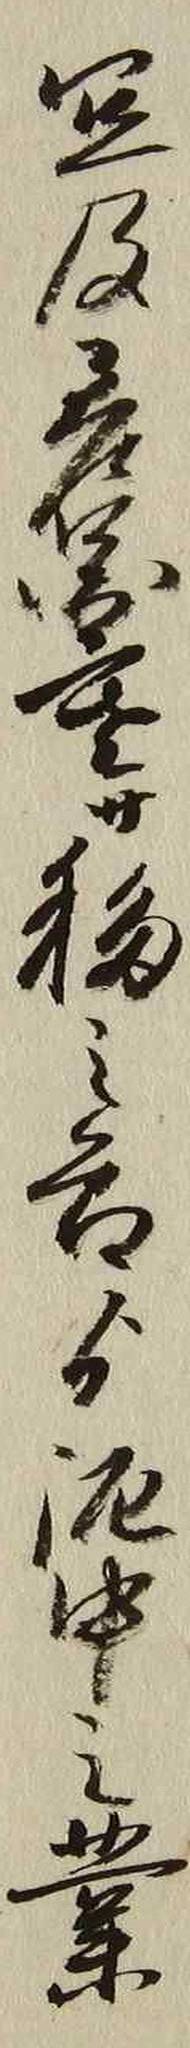宜及差図重サ移之節ゟ泥中之業
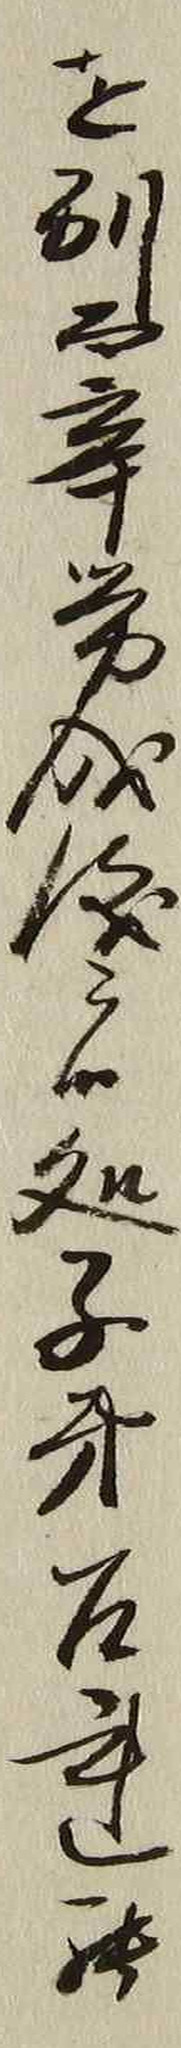を別而辛労成儀ニ候処子弟召連罷
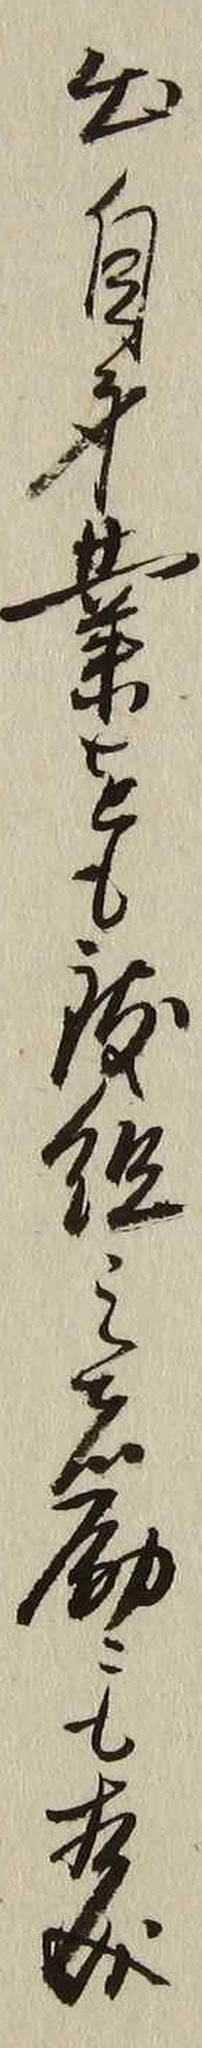出自身業をも致組之者励ニも相成
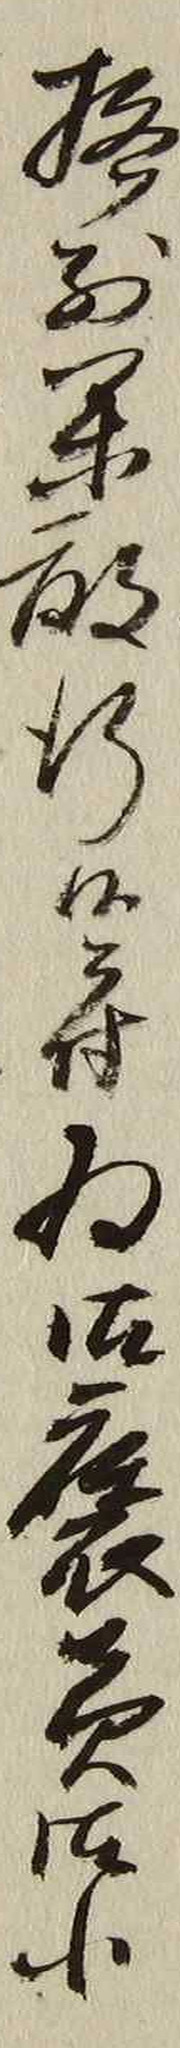格別果敢行候ニ付為御褒美御小
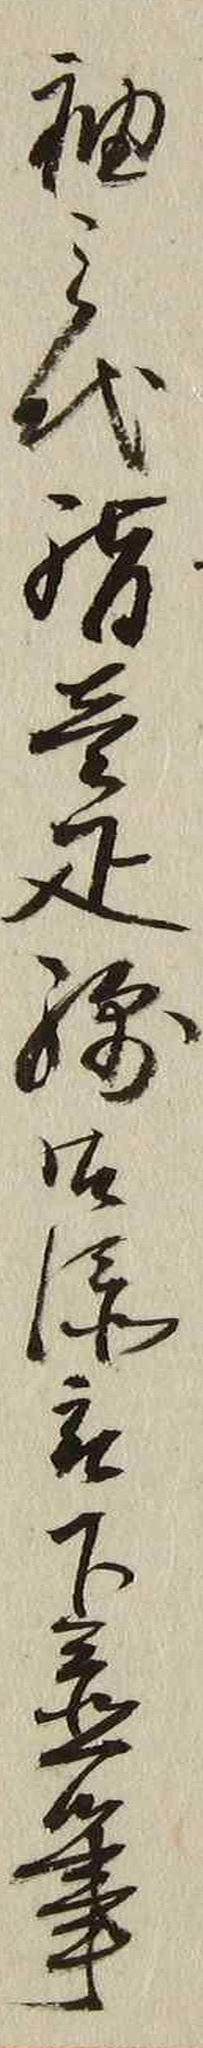袖之代絹壱疋綿御添被下置候事
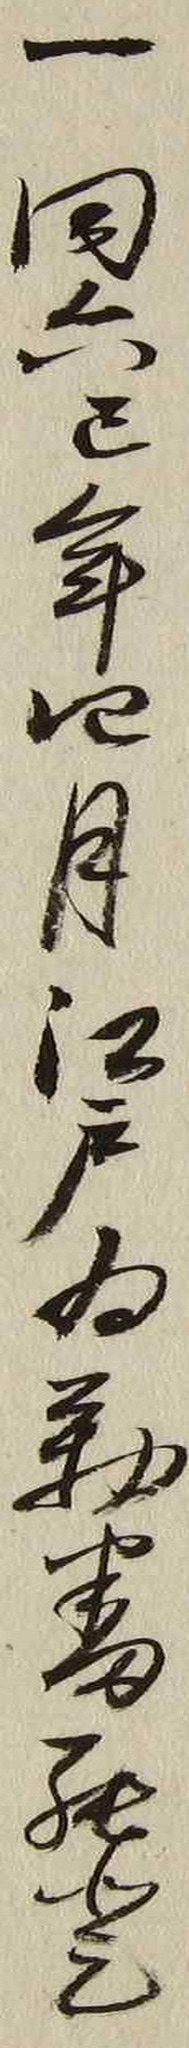一同六巳年四月江戸為勤番罷登
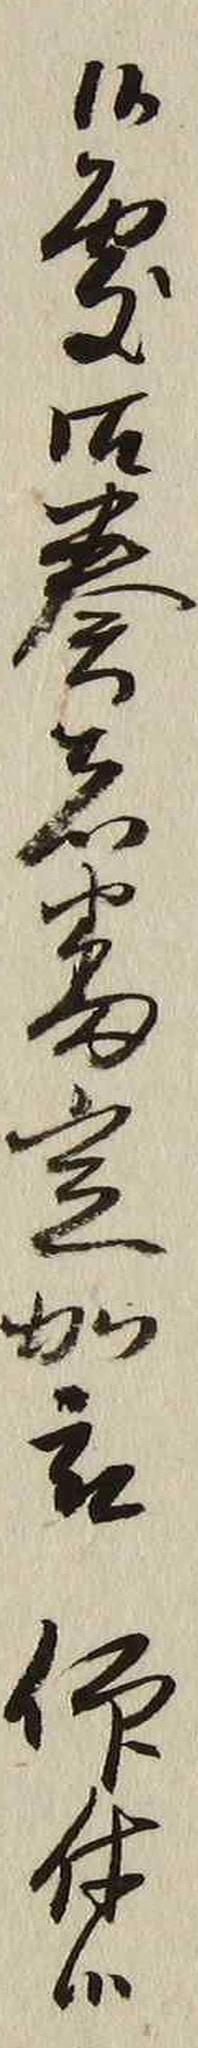候処御奏者番定加被仰付候
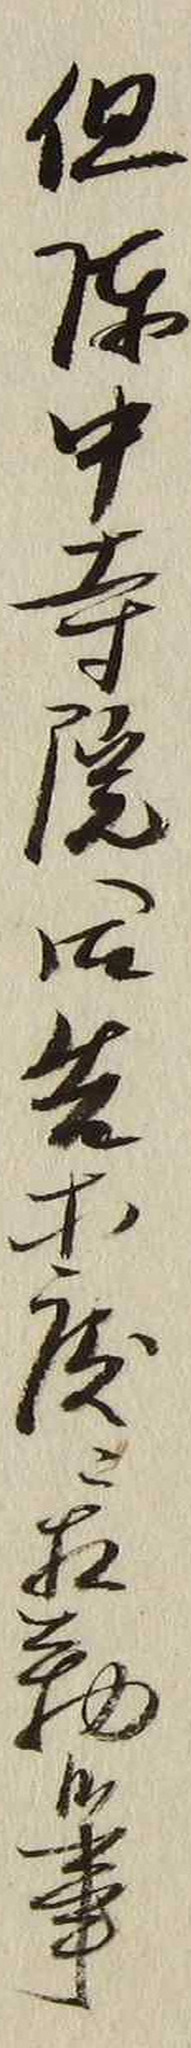但陳中寺院へ御先等度ニ相勤候事
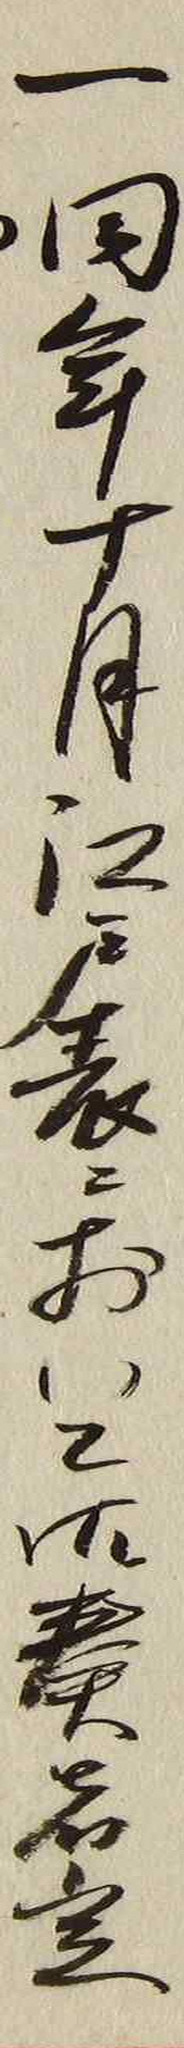一同年十月江戸表ニおいて御奏者定
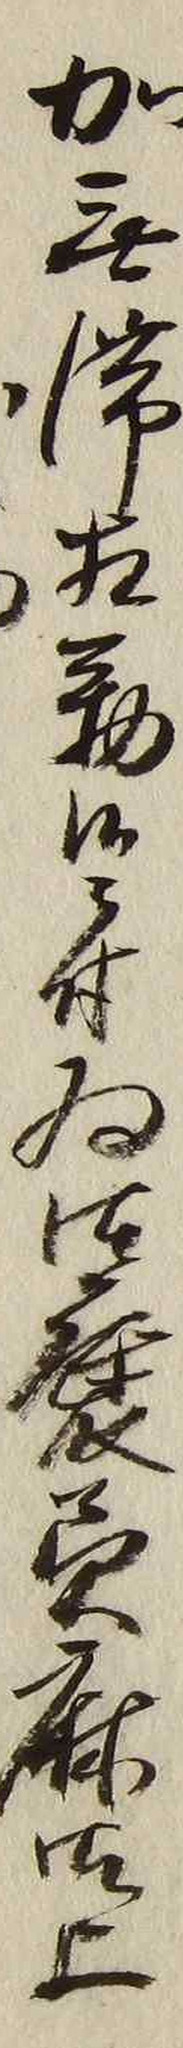加無滞相勤候ニ付為御褒美麻御上
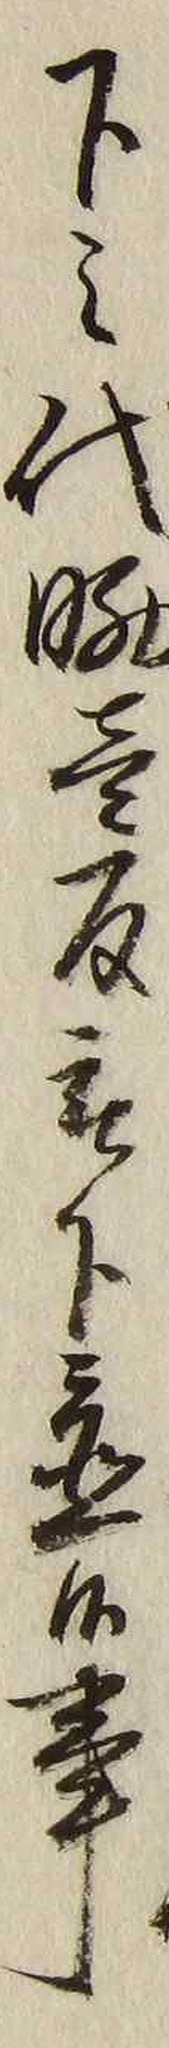下之代晒壱反被下置候事

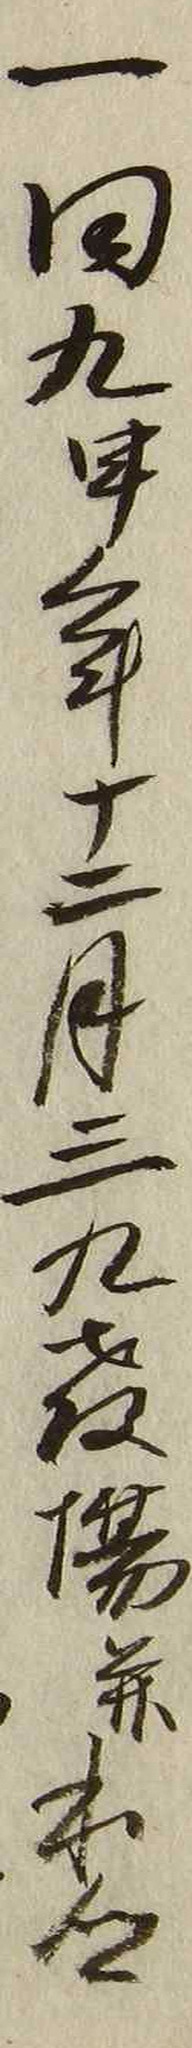一同九申年十二月三丸教場并本郷
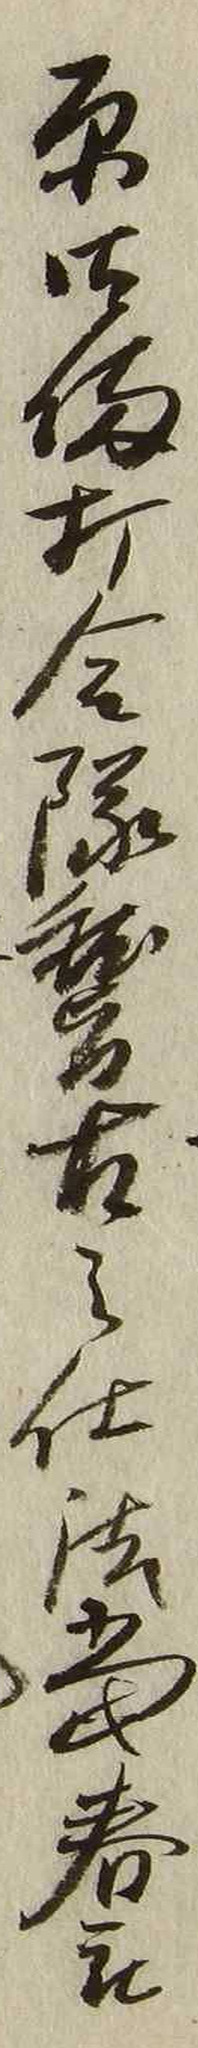原御備打合隊稽古之仕法当春被
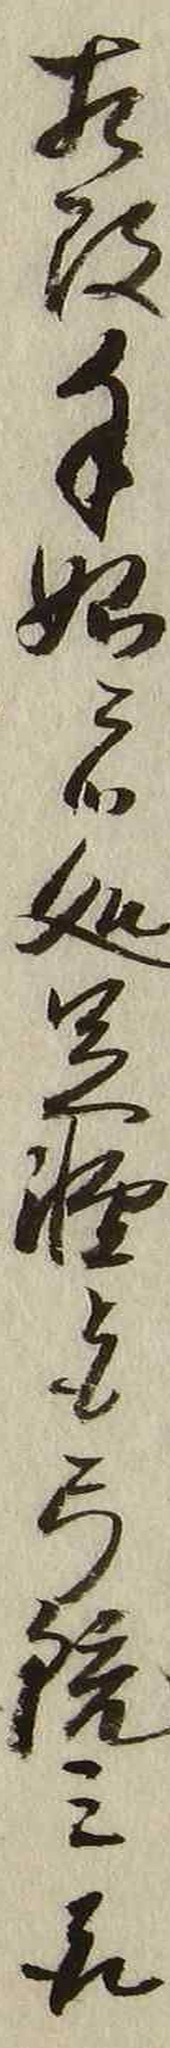相改手始ニ候処足軽とも弓銃之取
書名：諸士系譜　巻之356　す之部6
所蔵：会津若松市立会津図書館
